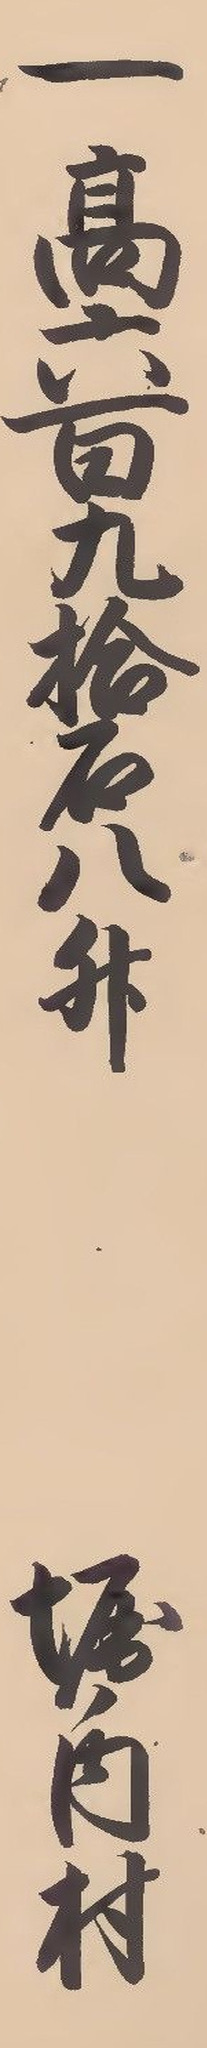一高六百九拾石八升堀ノ内村
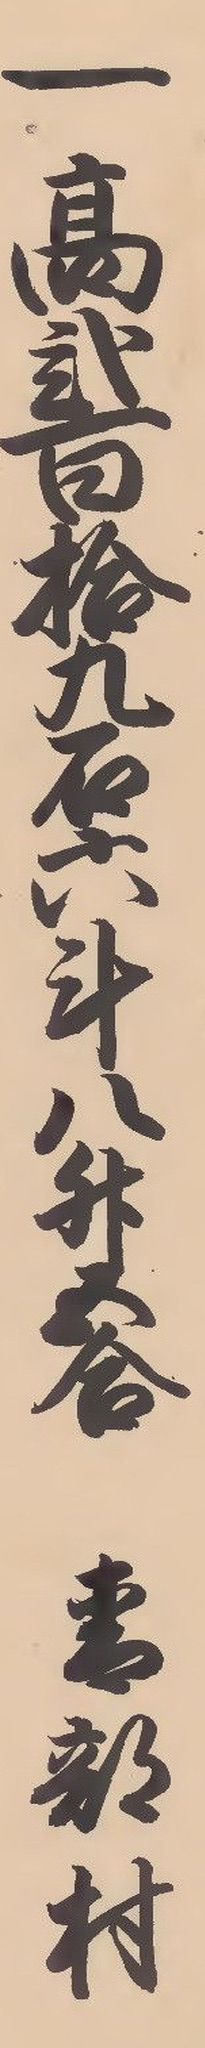一高弐百拾九石六斗八升五合青部村
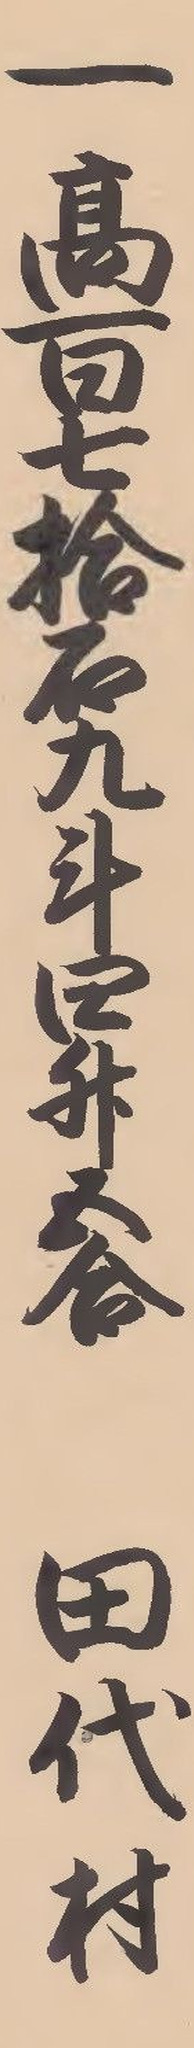一高百七拾石九斗四升五合田代村
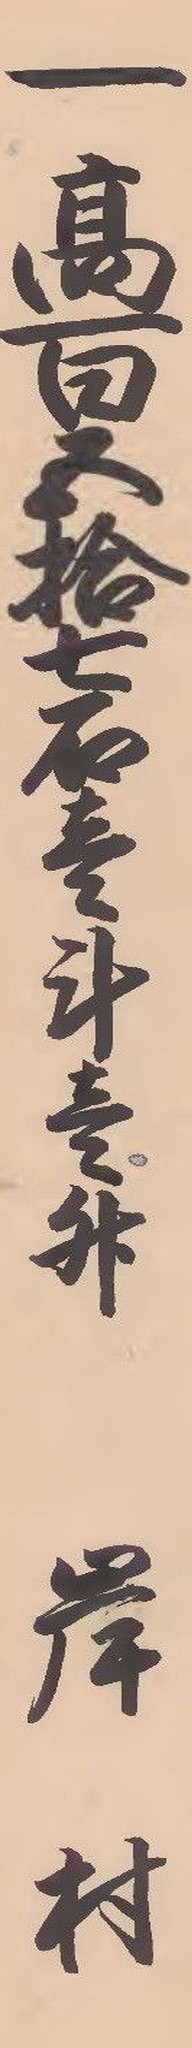一高百五拾七石壱斗壱升岸村

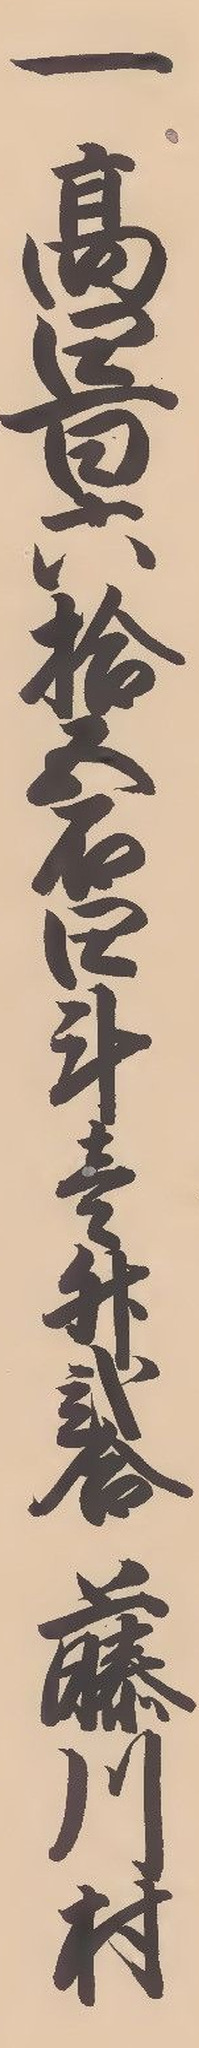一高四百六拾五石四斗壱升弐合藤川村
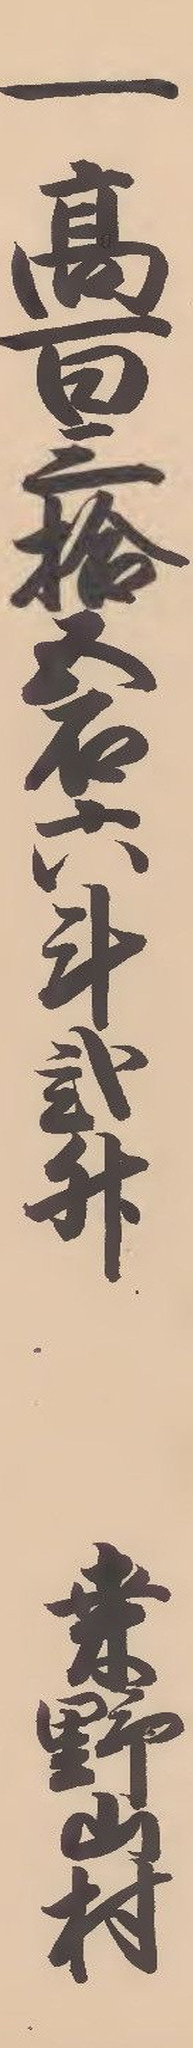一高百三拾五石六斗弐升桑野山村
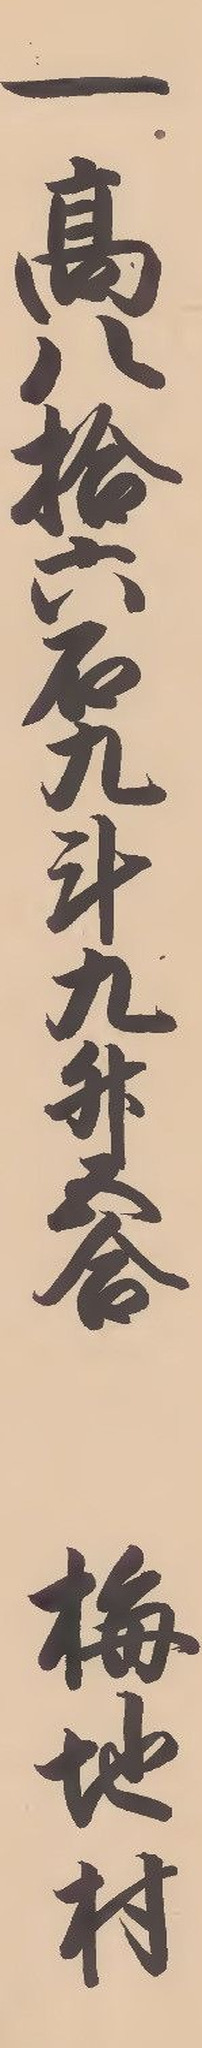一高八拾六石九斗九升五合梅地村
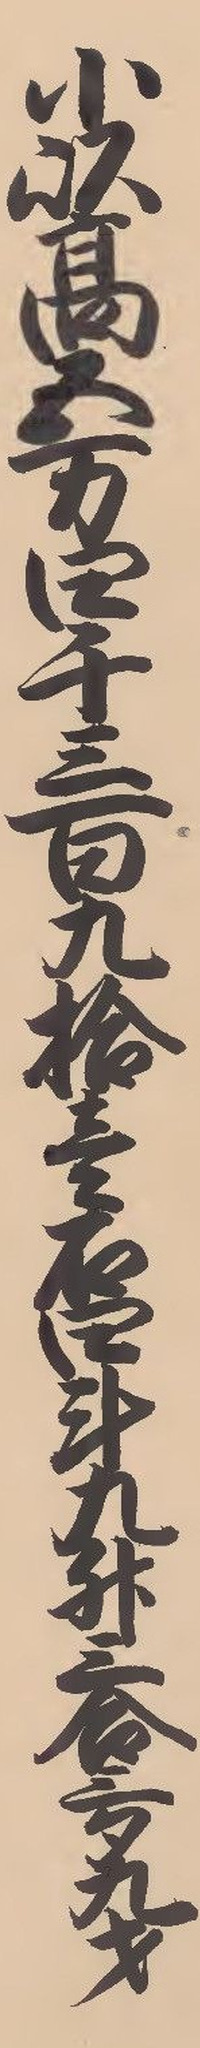小以高五万四千三百九拾壱石四斗九升三合三勺九才

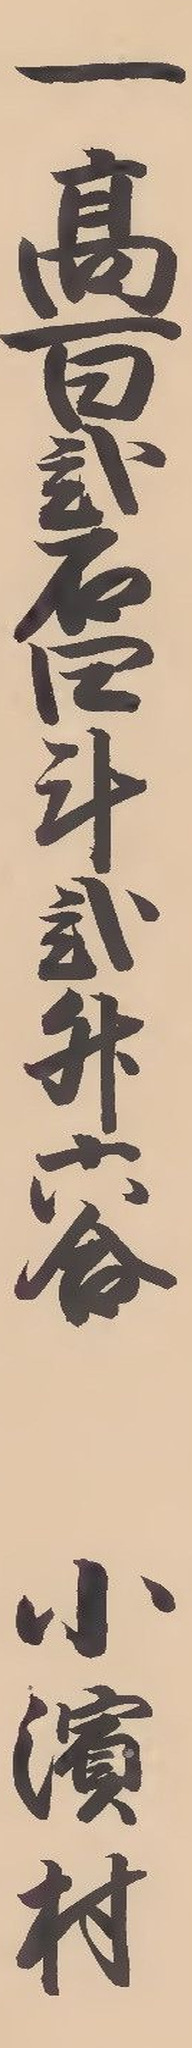一高百弐石四斗弐升六合小浜村
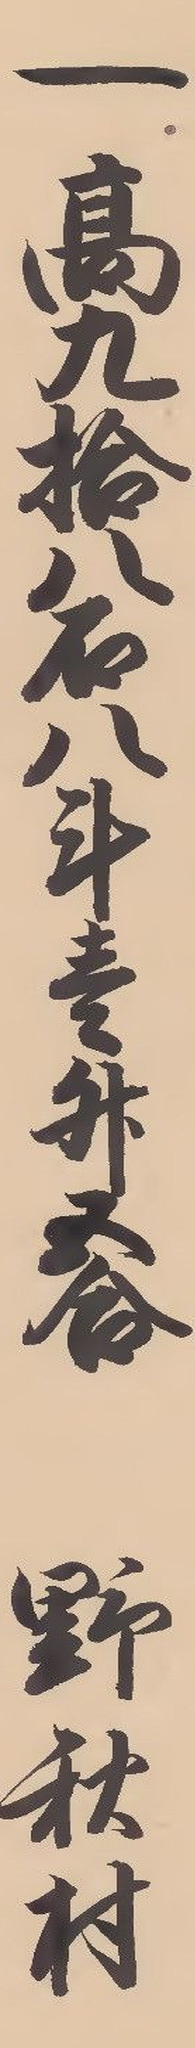一高九拾八石八斗壱升五合野秋村
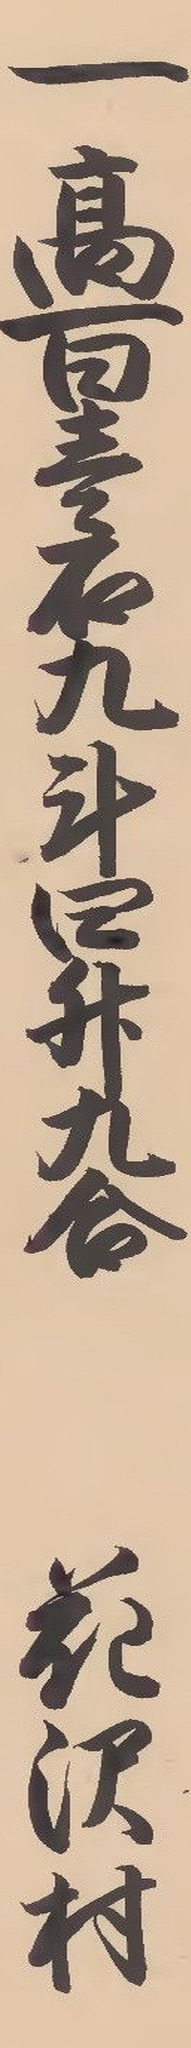一高百壱石九斗四升九合花沢村
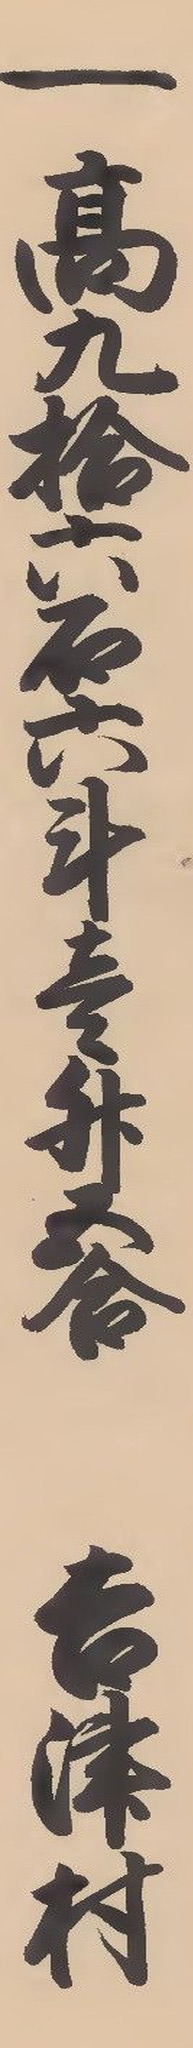一高九拾六石六斗壱升五合吉津村
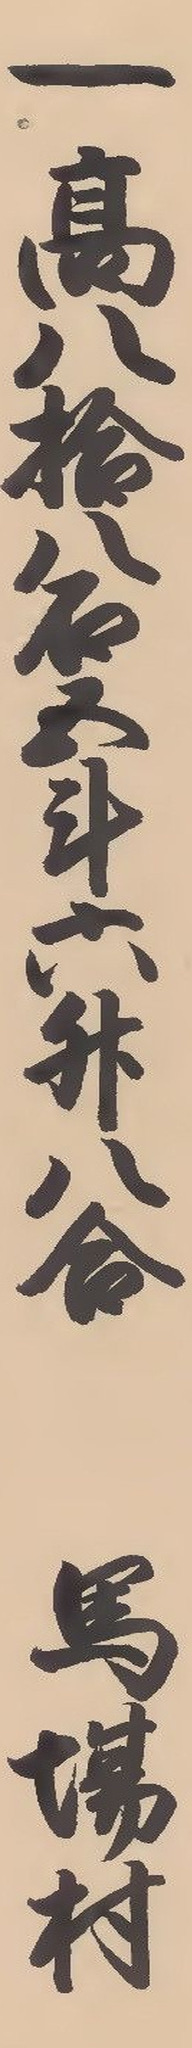一高八拾八石五斗六升八合馬場村
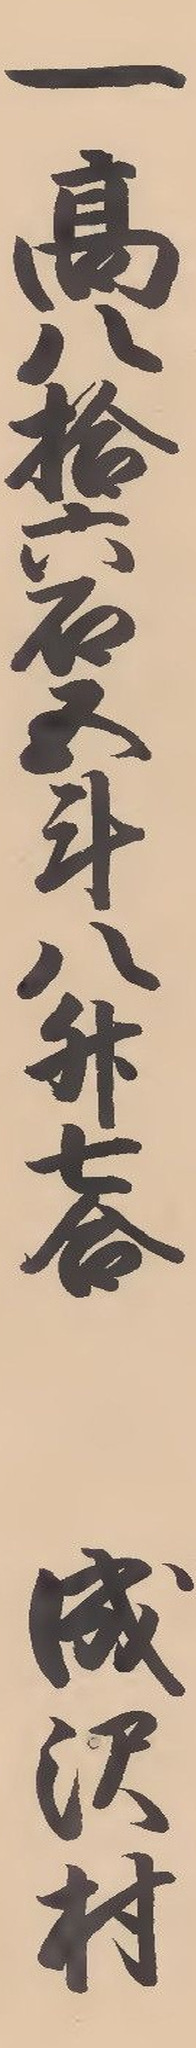一高八拾六石五斗八升七合成沢村
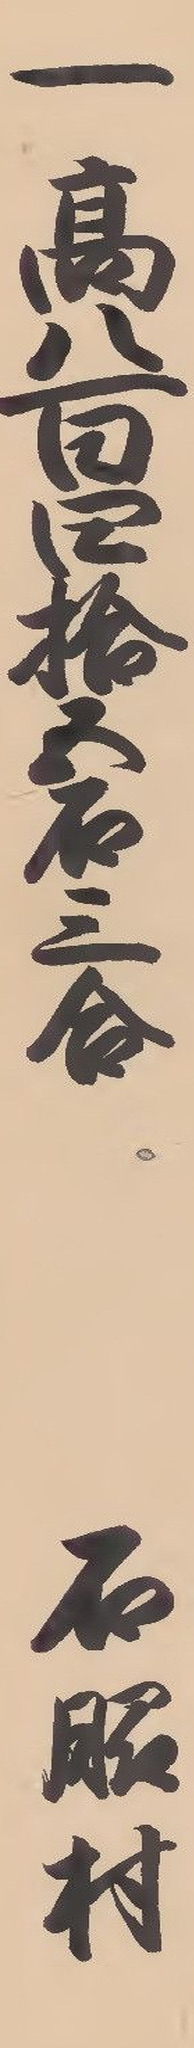一高八百四拾五石三合石脇村

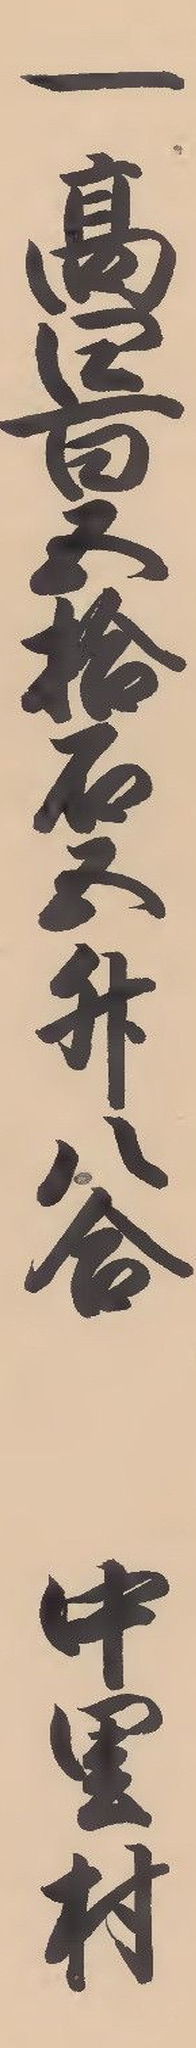一高四百五拾石五升八合中里村
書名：駿河国郷帳
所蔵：国立公文書館 National Archives of Japan
